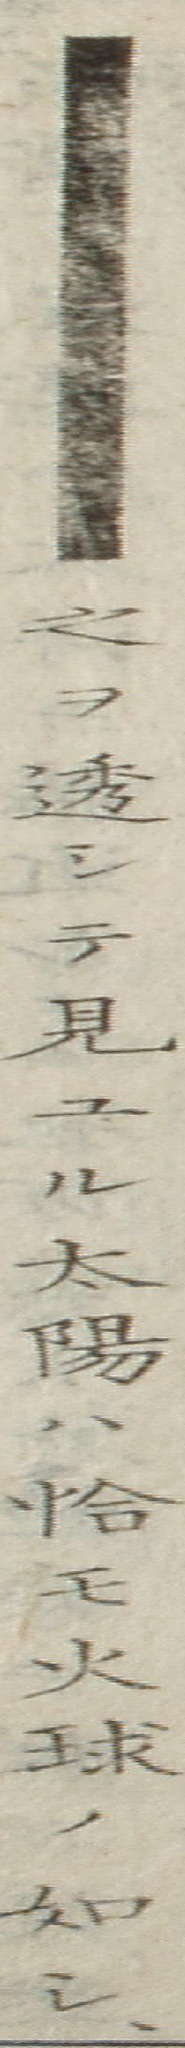之ヲ透シテ見ユル太陽ハ恰モ火球ノ如シ、
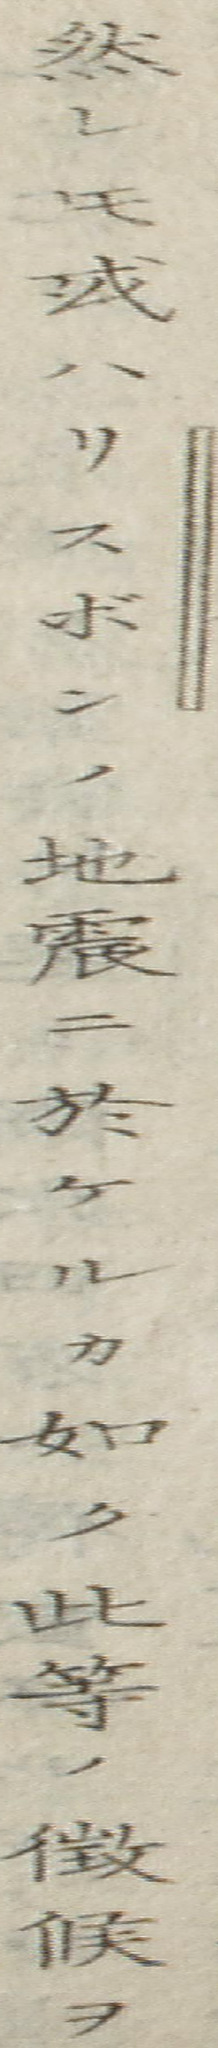然レトモ或ハリスボンノ地震ニ於ケルカ如ク此等ノ徴候ヲ
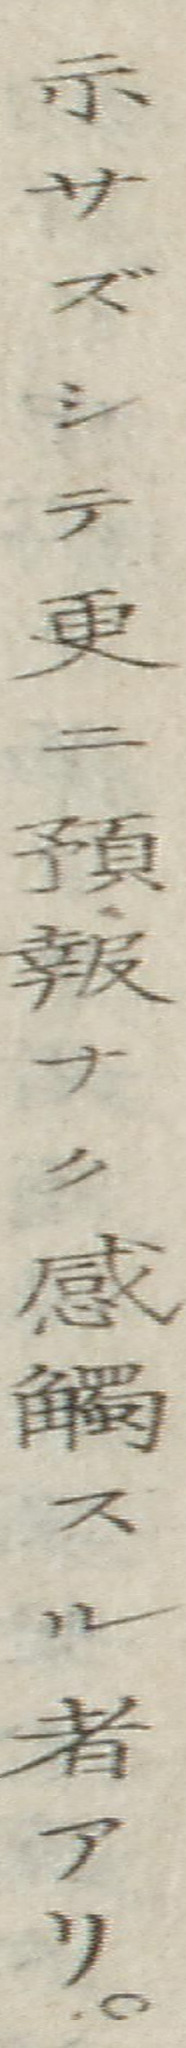示サズシテ更ニ予報ナク感触スル者アリ。
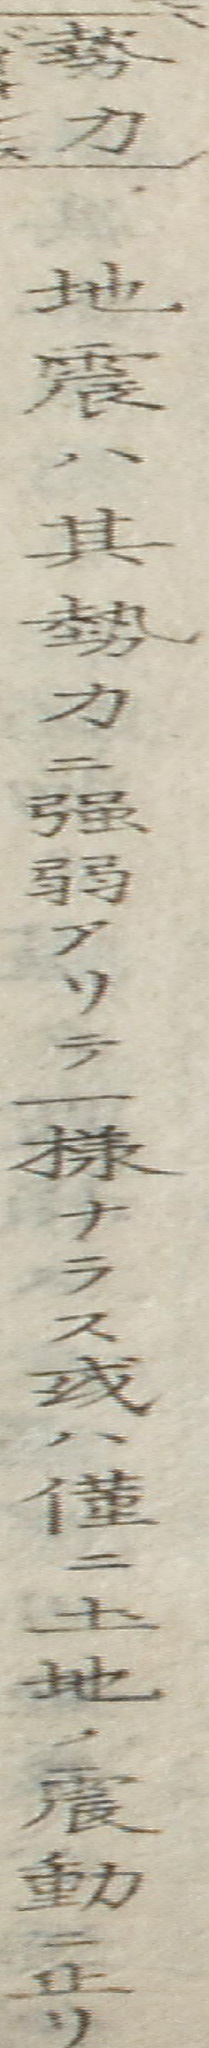廿七[勢力]地震ハ其勢力ニ強弱アリテ一様ナラス或ハ僅ニ土地ノ震動ニ止リ
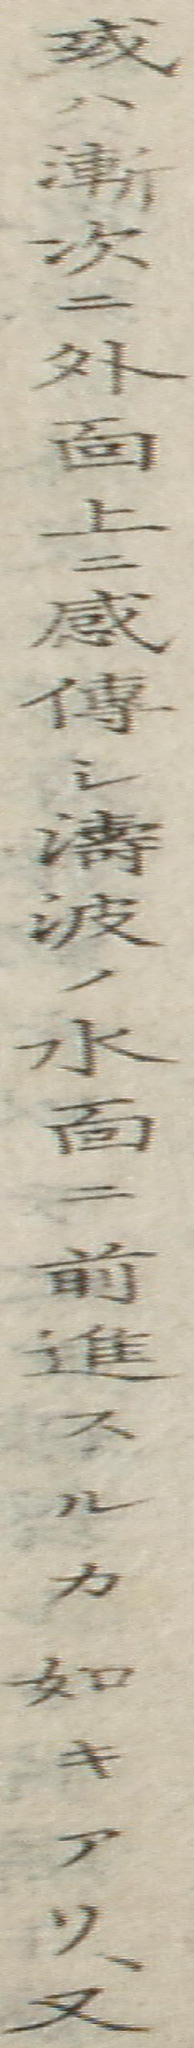或ハ漸次ニ外面上ニ感伝シ濤波ノ水面ニ前進スルカ如キアリ、又

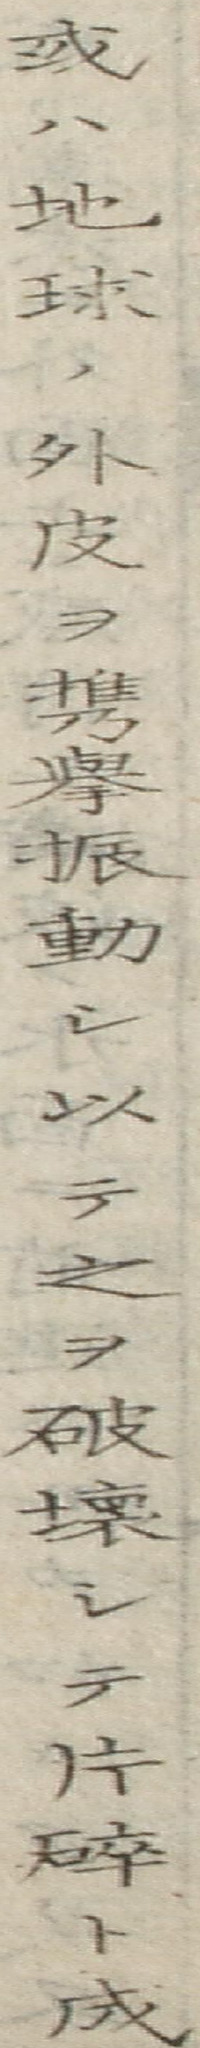或ハ地球ノ外皮ヲ携挙振動シ以テ之ヲ破壊シテ片砕ト成
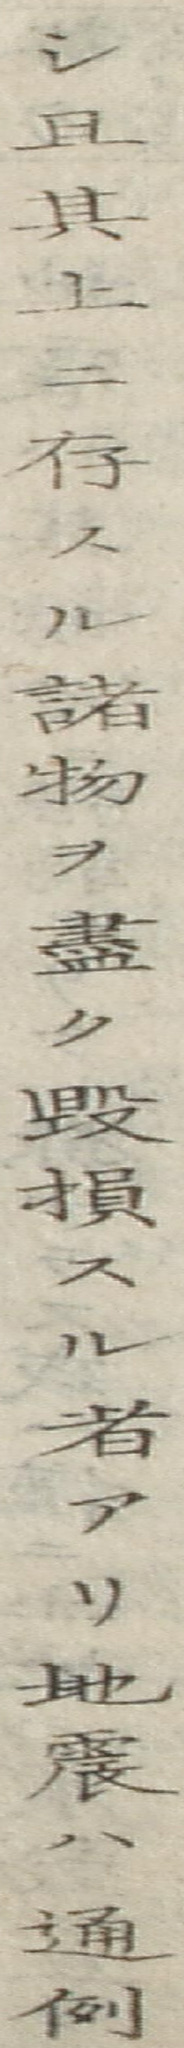シ且其上ニ存スル諸物ヲ盡ク毀損スル者アリ地震ハ通例
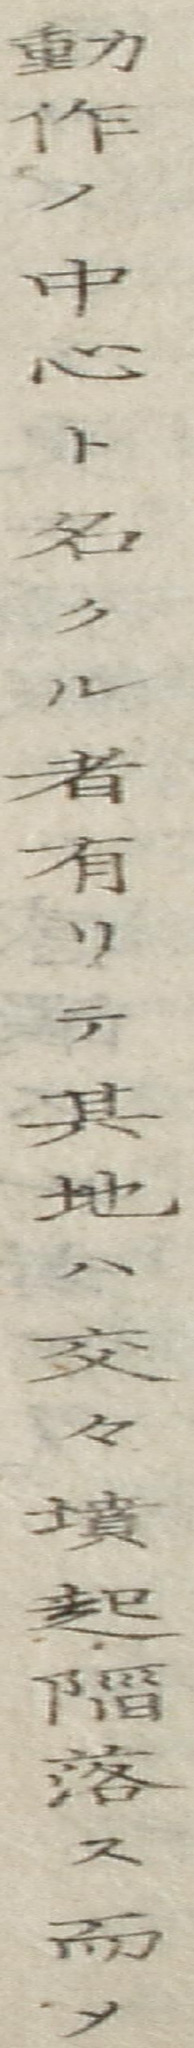動作ノ中心ト名クル者有リテ其地ハ交々墳起陥落ス而シテ
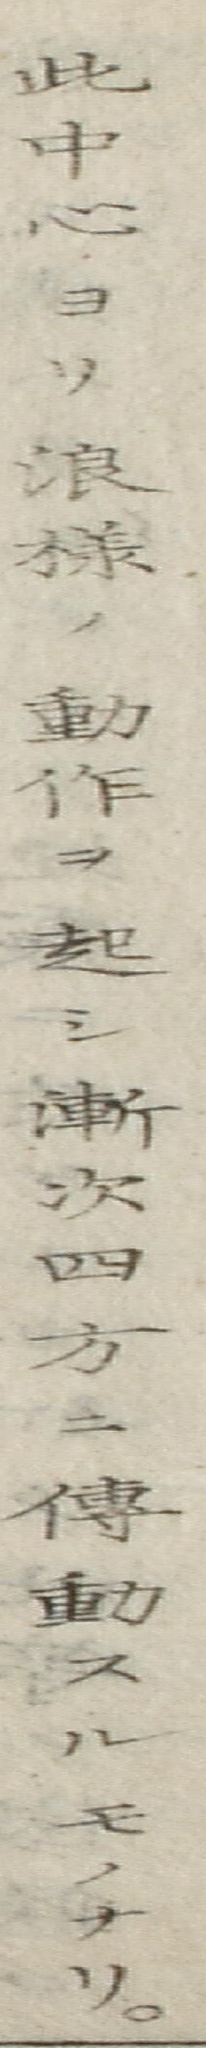此中心ヨリ浪様ノ動作ヲ起シ漸次四方ニ伝動スルモノナリ。
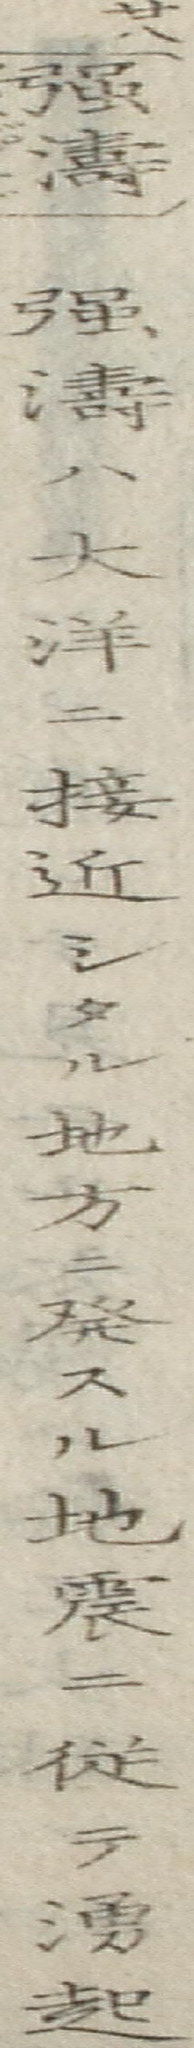廿八[強濤]強濤ハ大洋に接近シタル地方ニ発する地震ニ従テ湧起
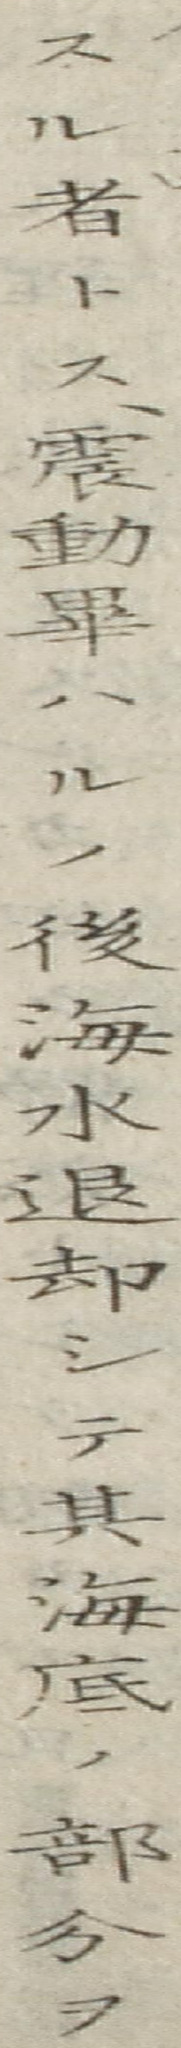スル者トス、震動畢ハルノ後海水退却シテ其海底ノ部分ヲ
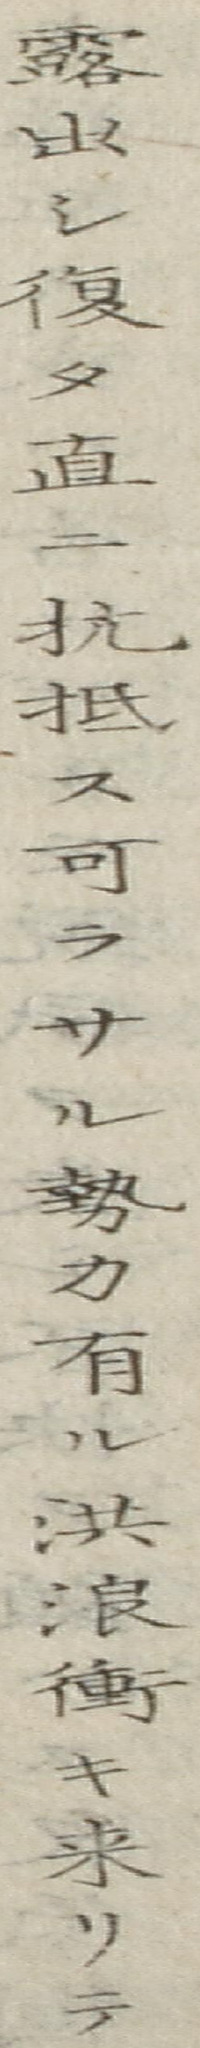露出シ復タ直ニ抗抵ス可ラサル勢力有ル洪浪衝キ来リテ
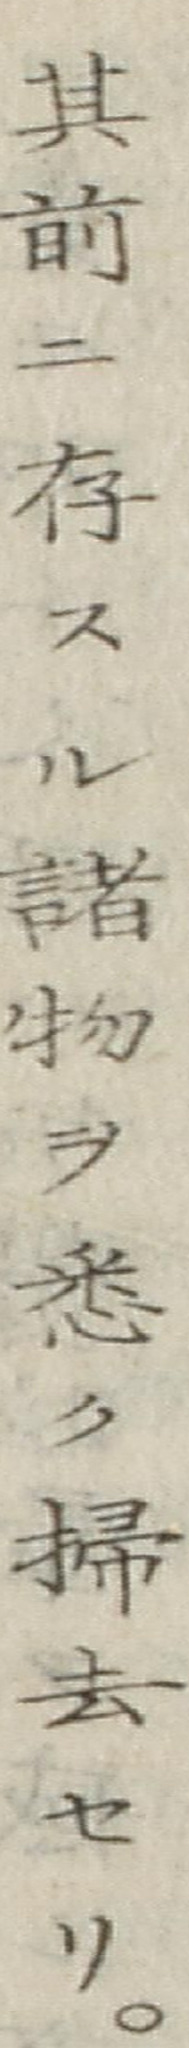其前ニ存スル諸物ヲ悉ク掃去セリ。
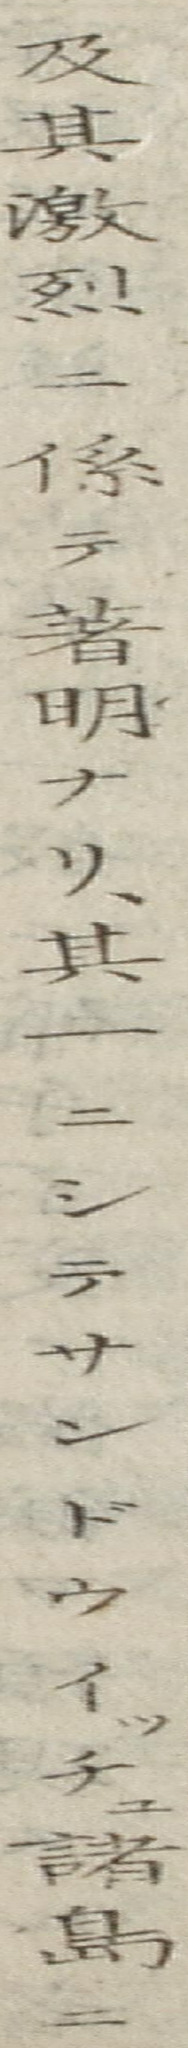及其激烈ニ係テ著明ナリ、其一ニシテサンドウイッチュ諸島ニ
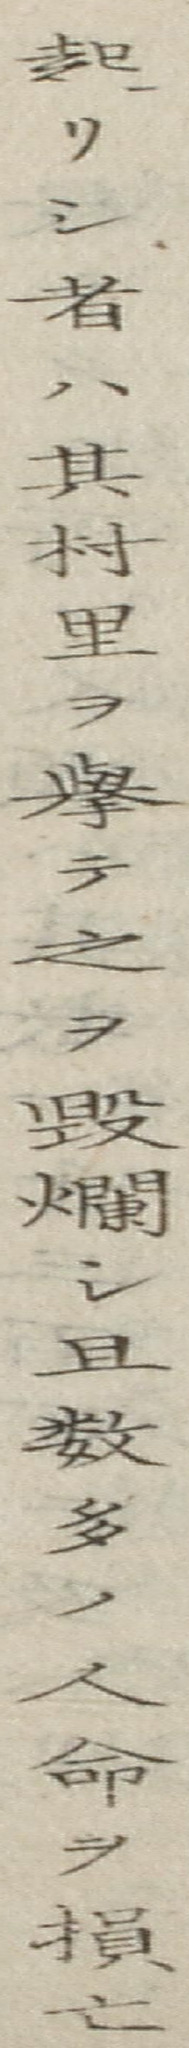起リシ者ハ其村里ヲ挙テ之ヲ毀爛シ且数多ノ人命ヲ損亡
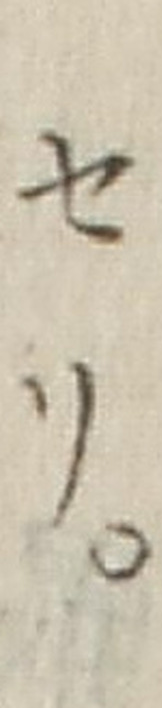セリ。
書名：地形論　巻二
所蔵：東京大学地震研究所図書室 Earthquake Research Institute Library, The University of Tokyo, JAPAN
